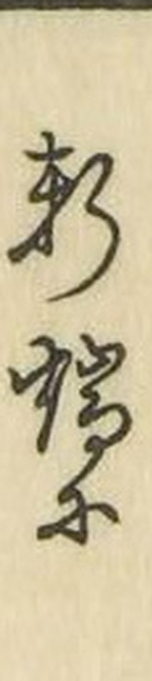軒端に
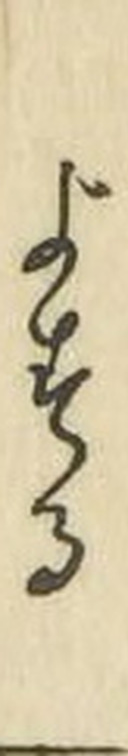よする
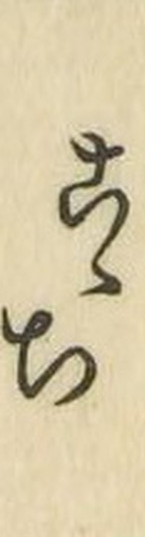こゝち
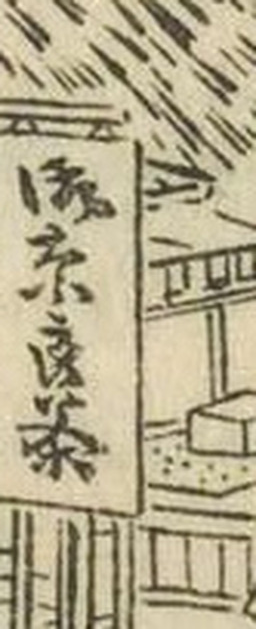御奈良茶
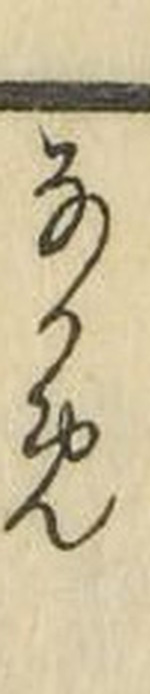なかめ
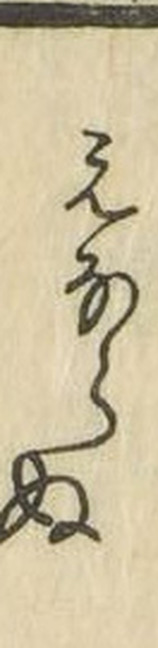えならぬ
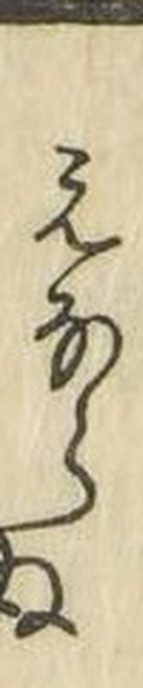えならぬ
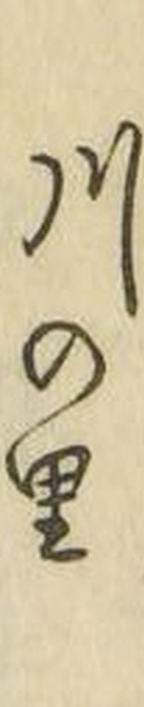川の里

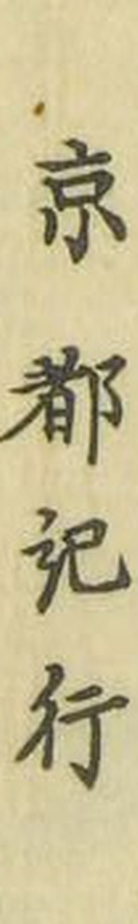京都記行
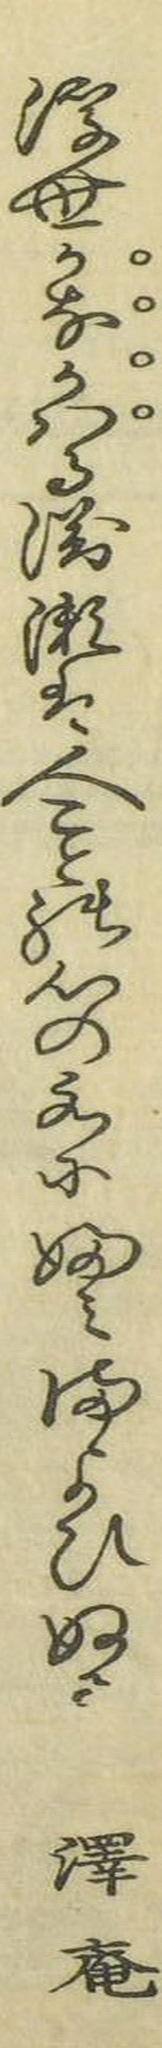浮世かなかはる淵瀬は人こと純心の水にふみまよひぬる澤庵
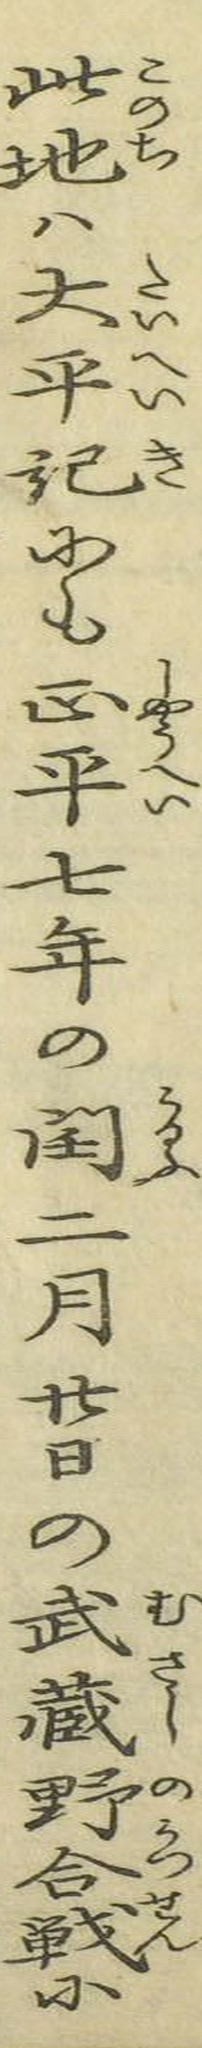此地は太平記にも正平七年の閏二月廿日の武蔵野合戦に
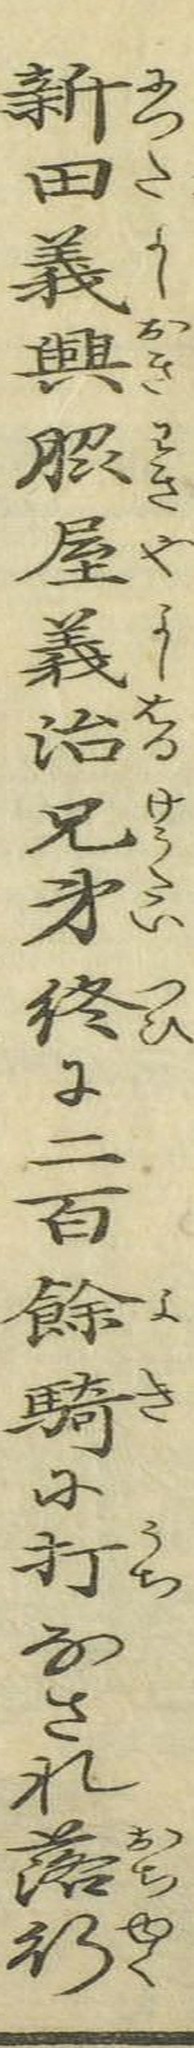新田義興脇屋義治兄弟終に二百餘騎に打なされ落行
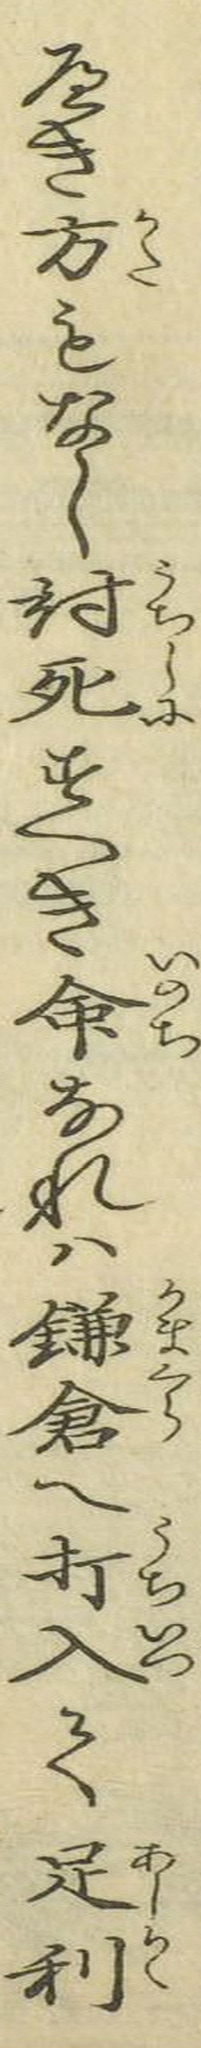へき方もなし討死すへき命なれは鎌倉へ打入て足利
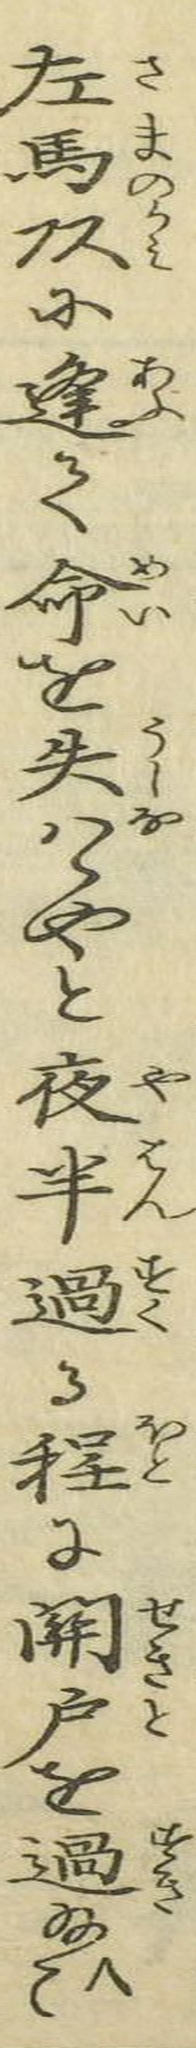左馬頭に逢て命を失はゝやと夜半過る程に関戸を過給ひ
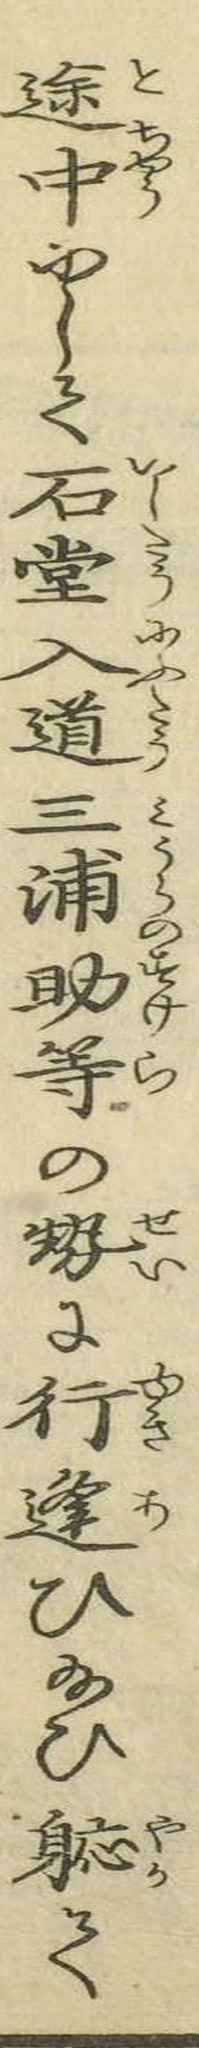途中にして石堂入道三浦助等の勢に行逢ひ給ひ軈て
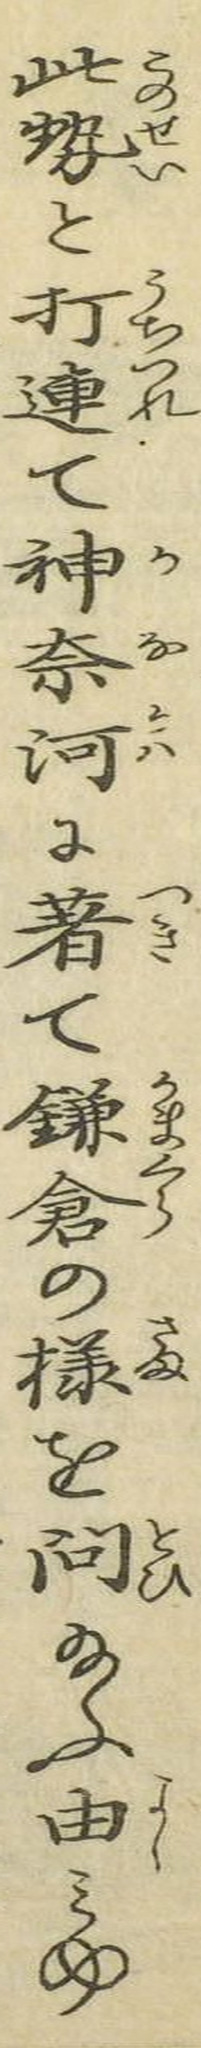此勢と打連て神奈河に著て鎌倉の様を問給ふ由みゆ
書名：江戸名所図会 20巻 巻之5
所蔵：東京学芸大学教育コンテンツアーカイブ
